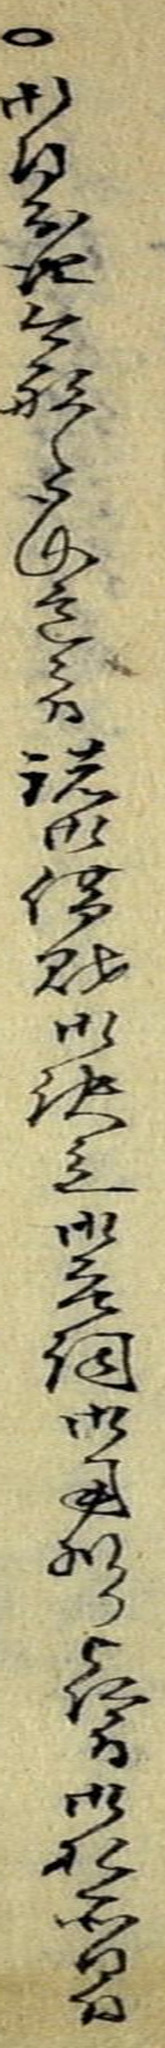○御自分儀今般之御趣意に付諸御借財御訳立御取調御用掛り被被仰付御札所目付
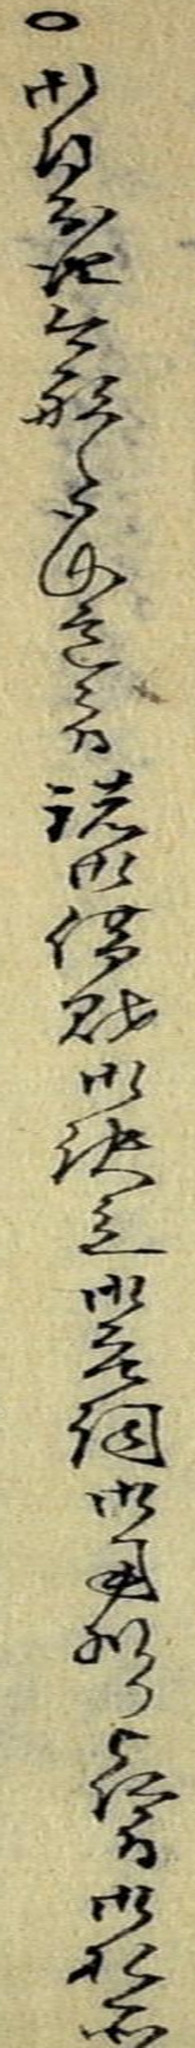○御自分儀今般之御趣意に付諸御借財御訳立御取調御用掛り被被仰付御札所目付
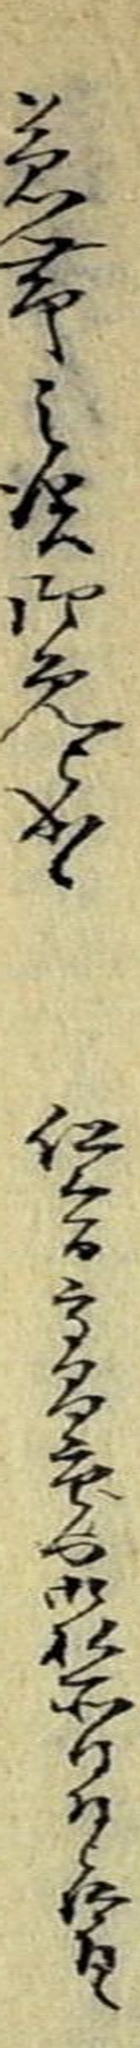兼帯之儀は御免被成候但今日高畠市郎右衛門御札所目付被仰付候
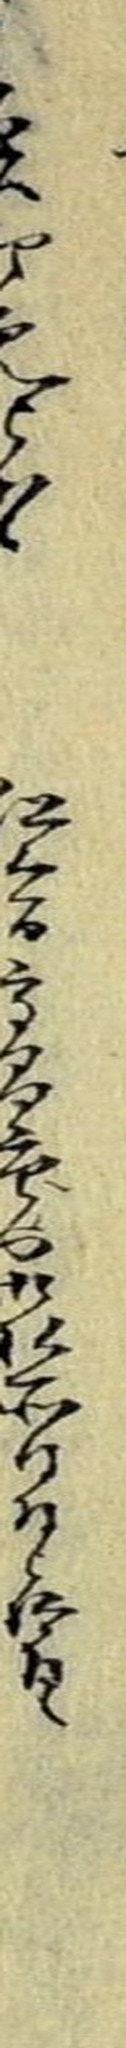兼帯之儀は御免被成候但今日高畠市郎右衛門御札所目付被仰付候
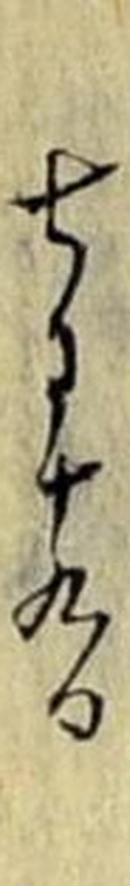七月十九日
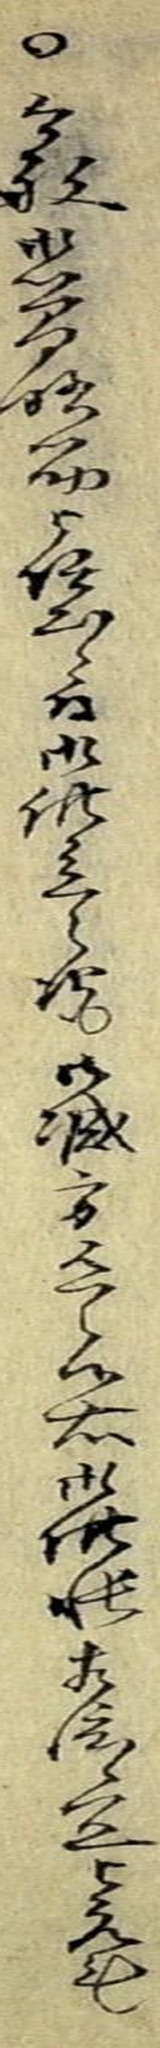○今般御簡略筋被仰出候に付御供立之儀も御減方有之候右御供帳相渡候宜被取斗候
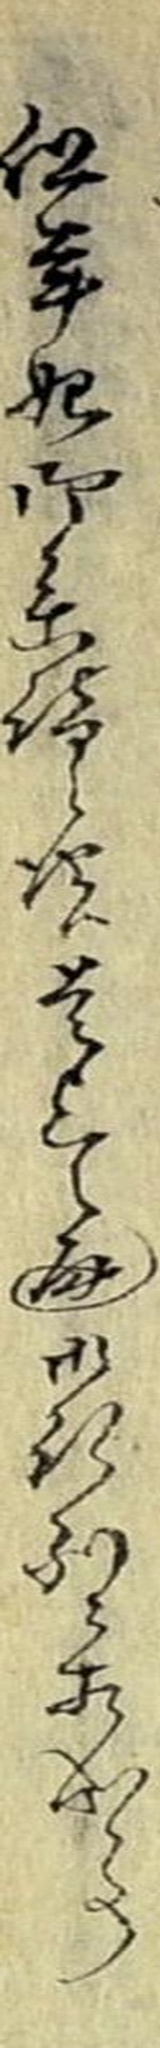但年始御参詣之儀は是迄之通御行列に相成候事
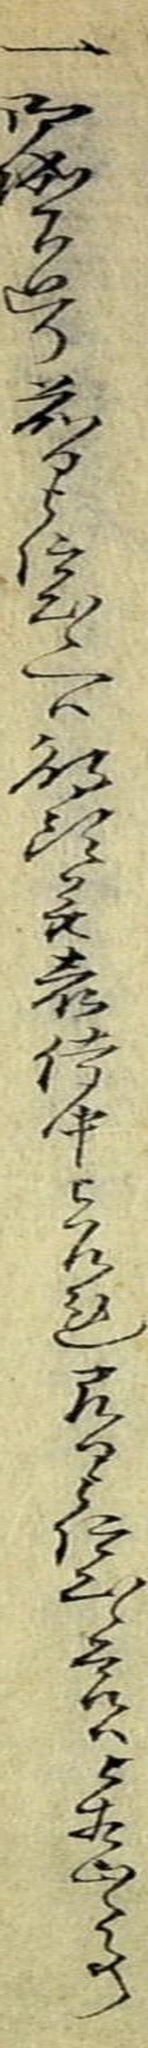一御城下廻り前日被仰出候へは触頭并表侍中被召連即日被仰出候節は被相止候事
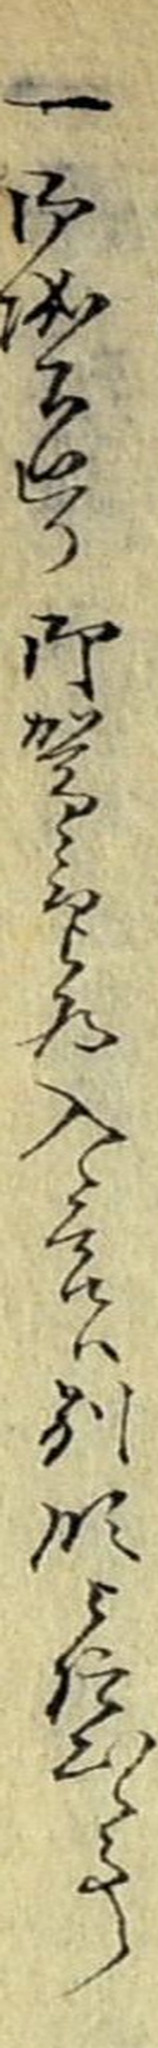一御城下廻り御駕に而被為入候節は別段被仰出候事
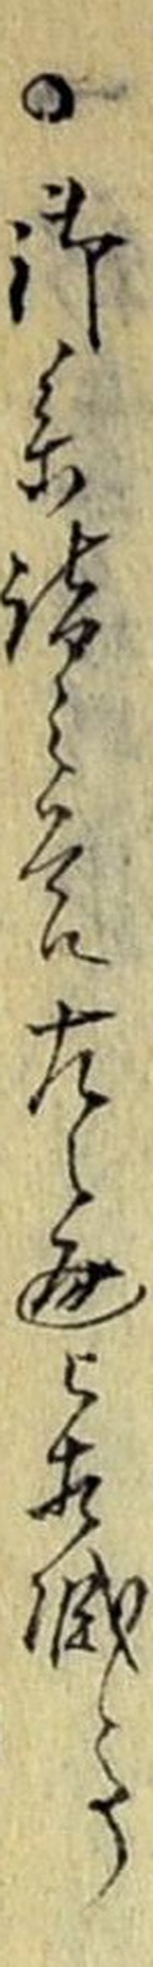○御参詣之節左之通被相減候事
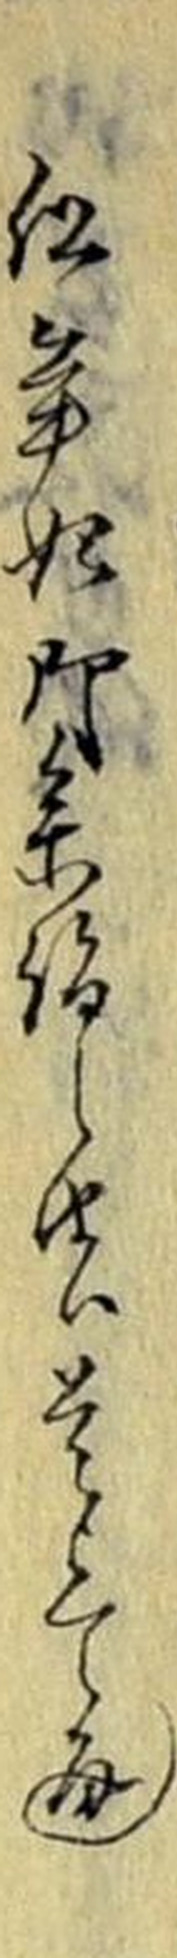但年始御参詣之儀は是迄之通

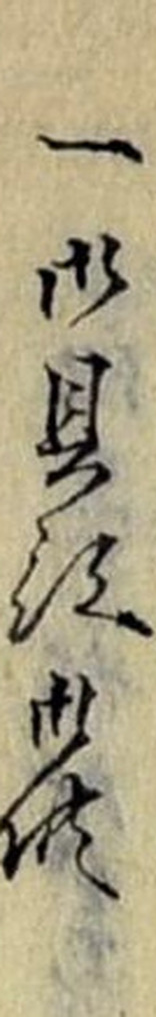一御具役御供
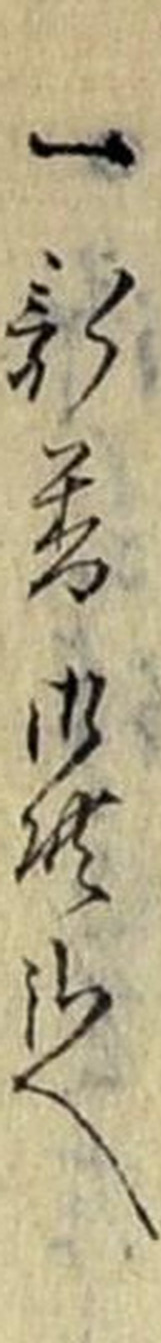一新番御供弐人
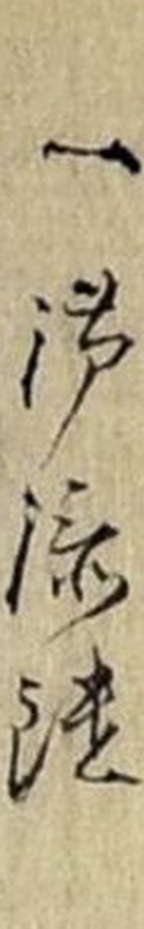一御添鑓
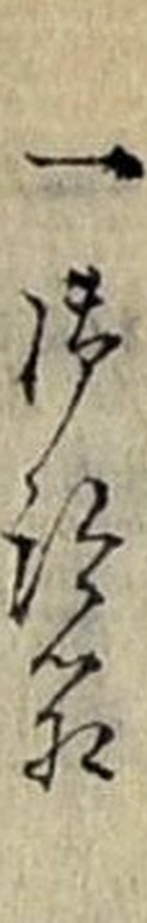一御跡箱
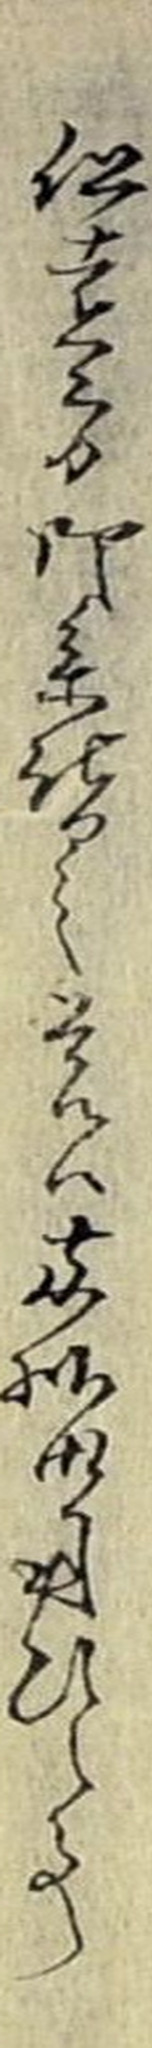但遠方御参詣之節は両掛御用ひ候事
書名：命令之部 六
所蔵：福井県文書館 Fukui Prefectural Archives
